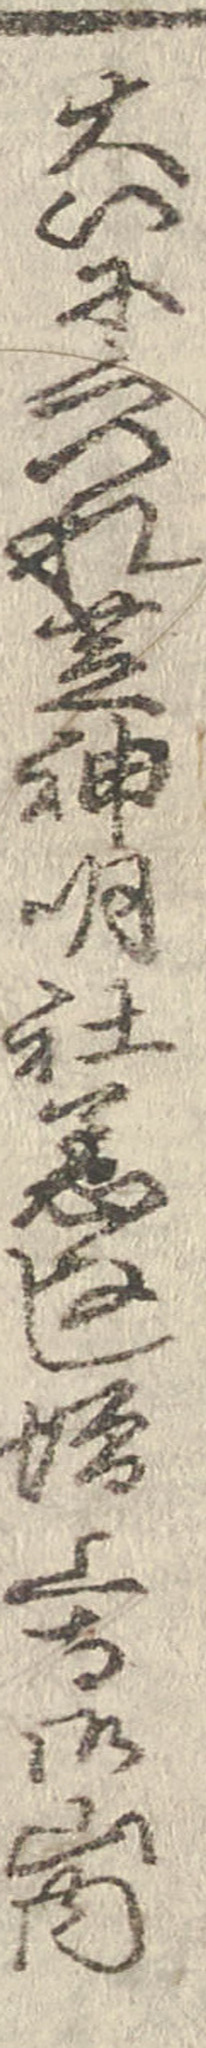大いにくづれ芝神明社悉なし増上寺御山内
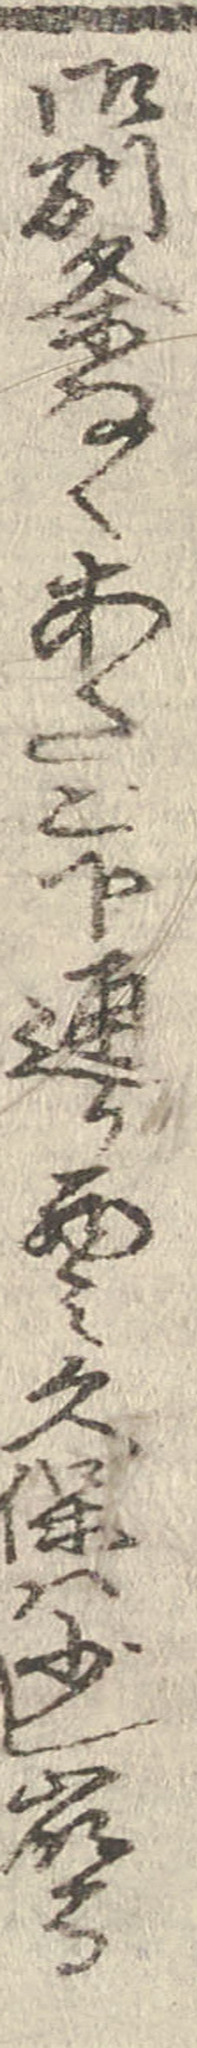御別条なくあたご下通り西之久保ハ少し崩る
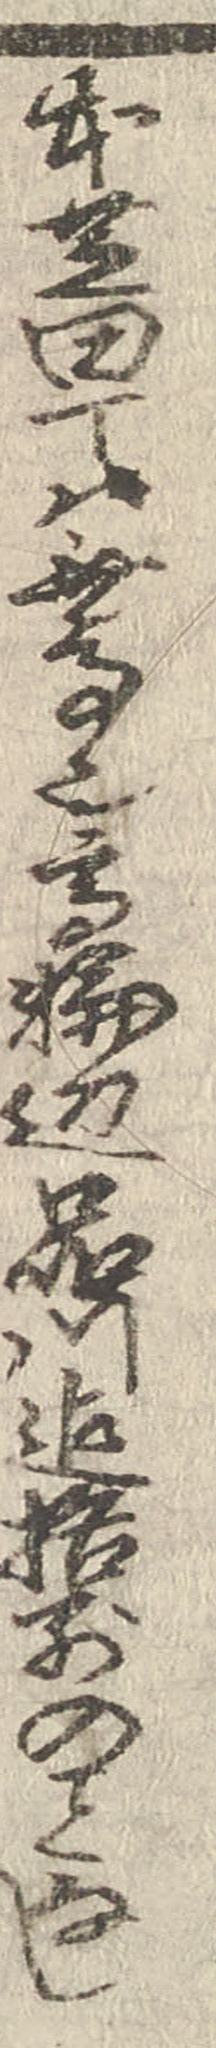本芝田丁ハ無事也高輪辺品川迄格別のことなし
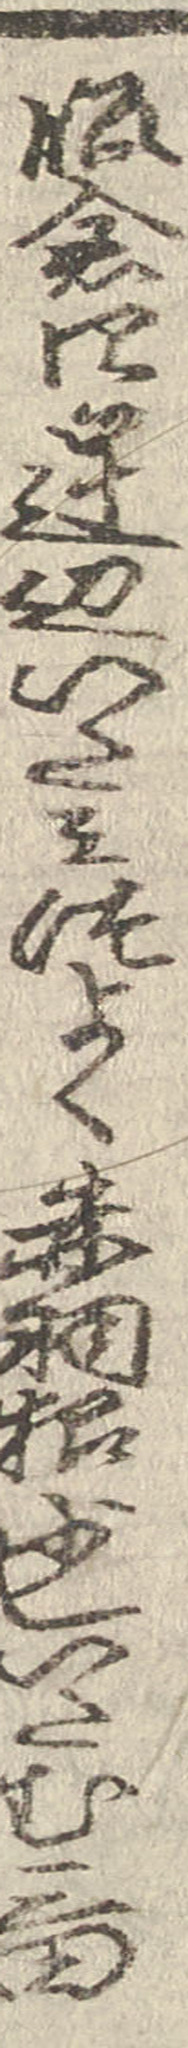飯倉四ツ辻辺いたミつよく赤羽根少しいたむ三田
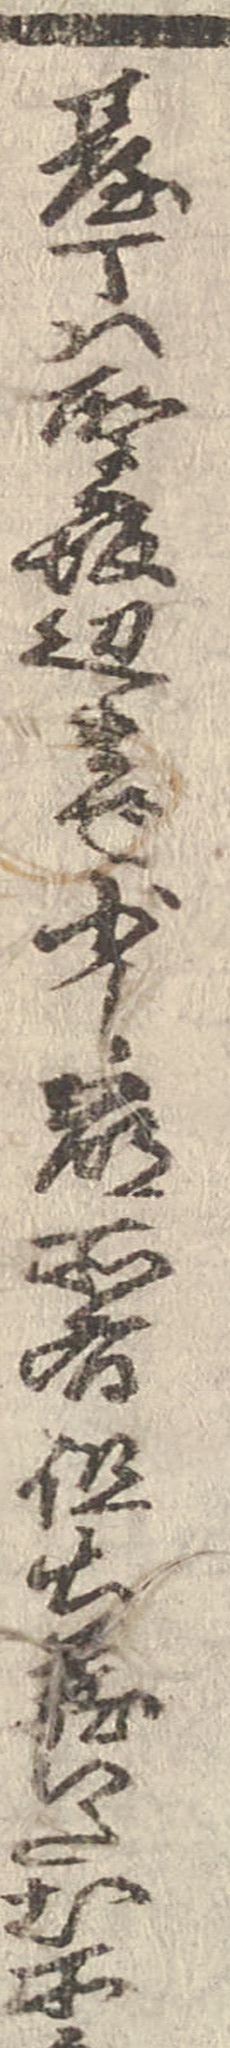臺丁ハ聖坂辺まで少し崩所有但土蔵いたむ所多し
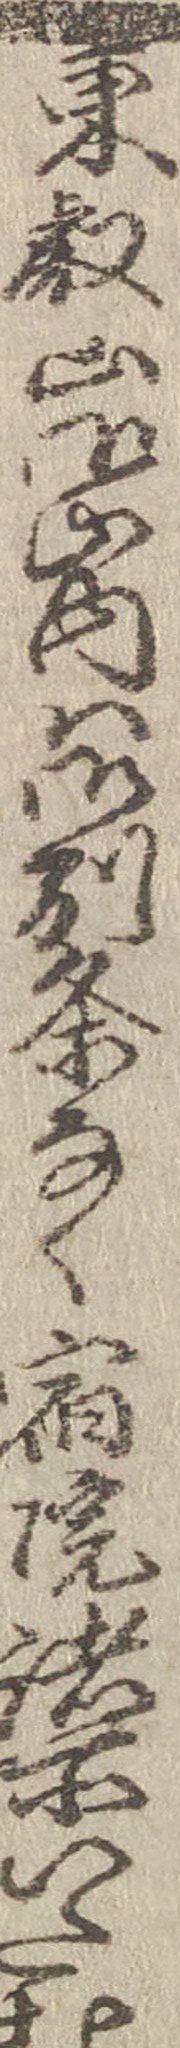東叡山御山内ハ御別条なく宿院諸所いたむ
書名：御江戸関八州大地震出火巨細記
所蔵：東京大学総合図書館 General Library in the University of Tokyo, JAPAN
